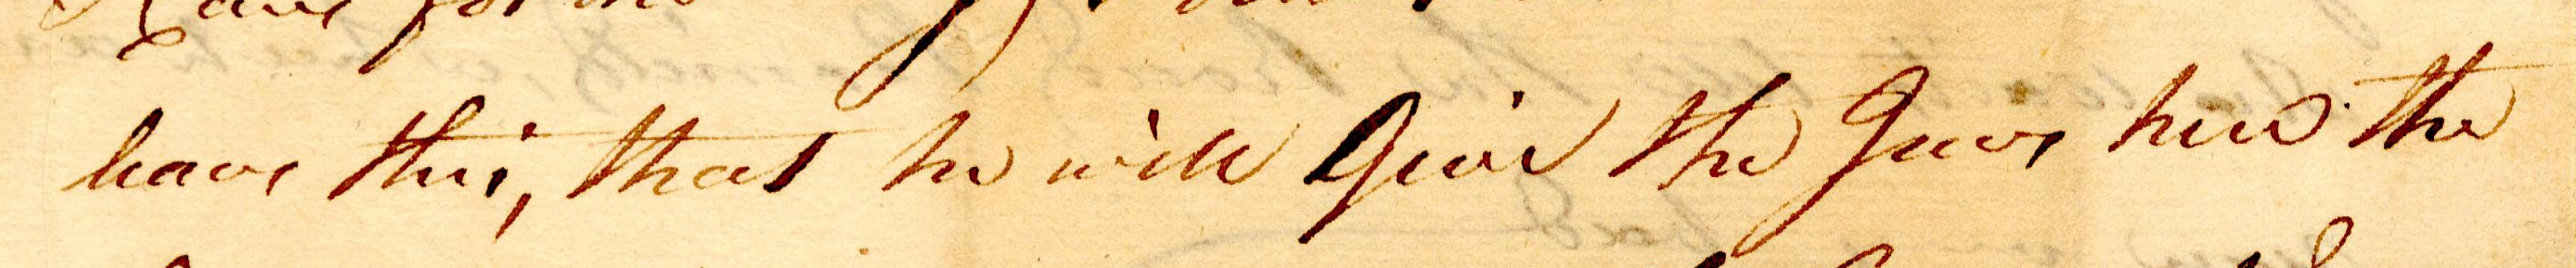leave this, that he will give the Jews here the
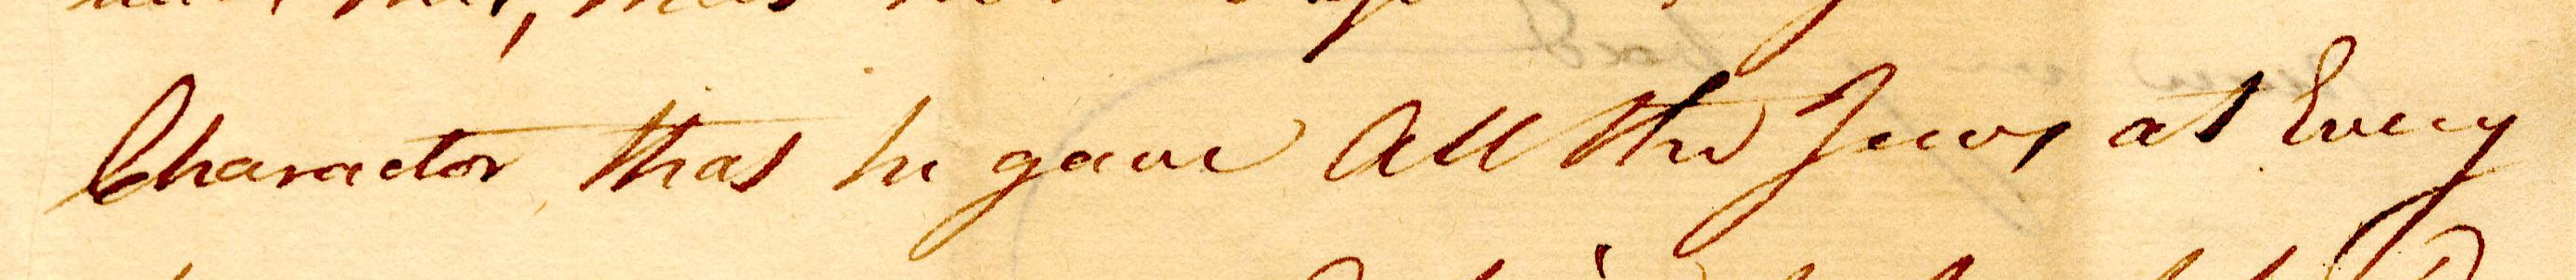Character that he gave All the Jews at Every
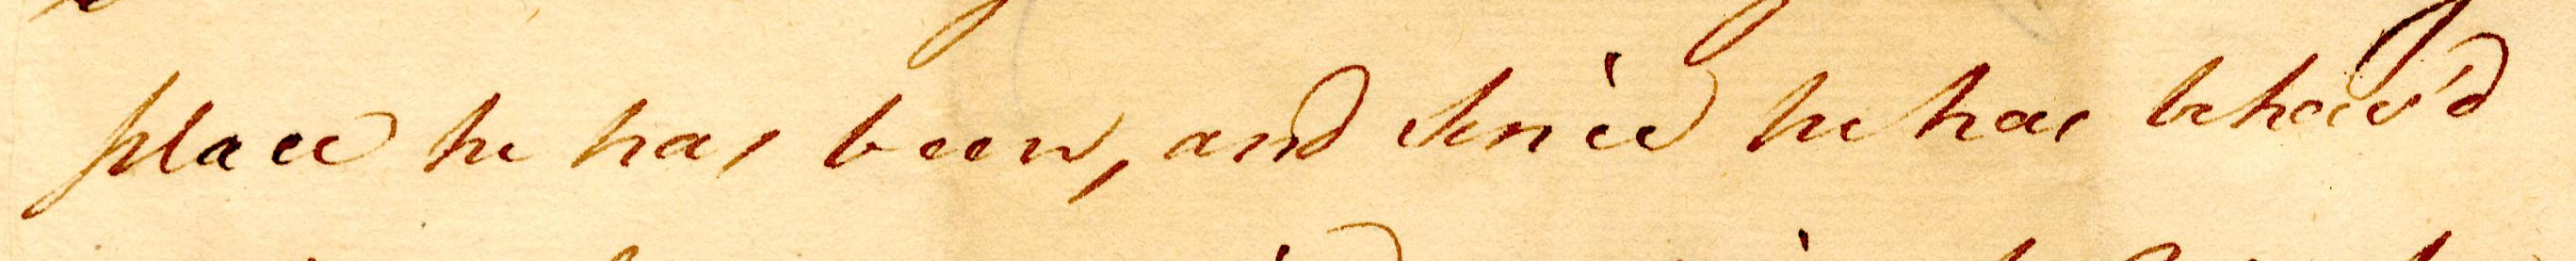place he has been, and Since he has behav'd
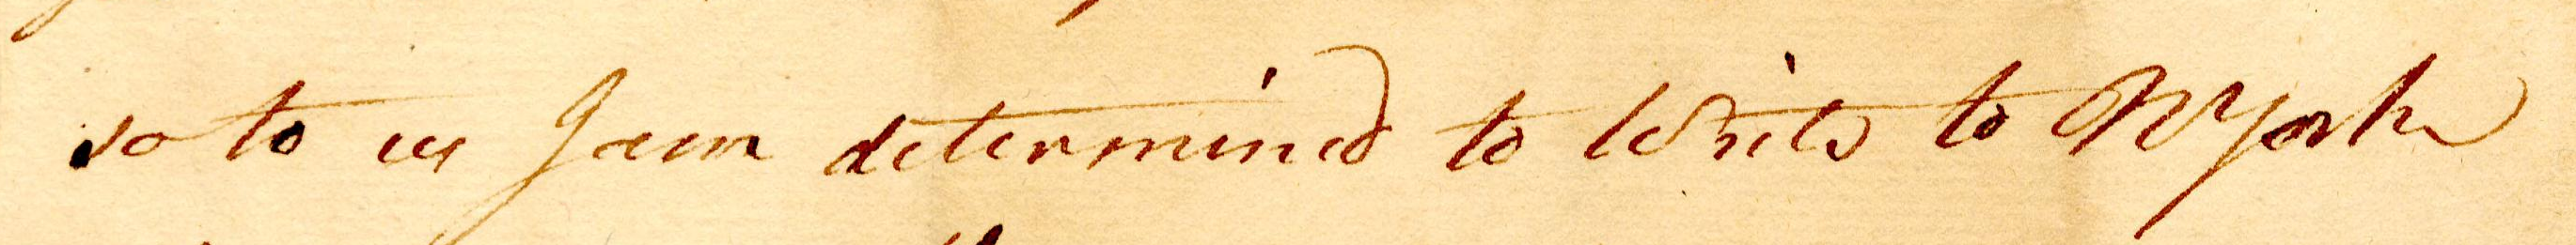so to us I am determined to write to N York
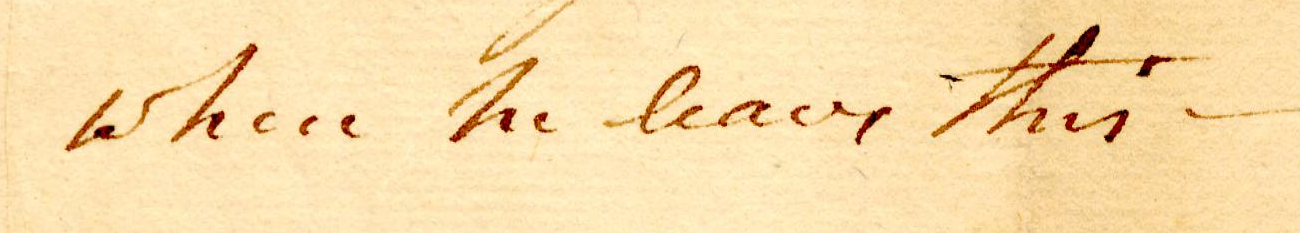where he leaves this-
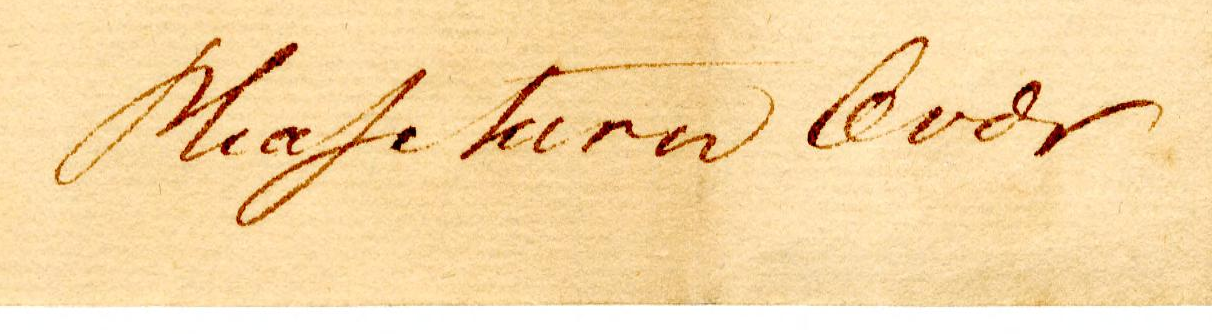Please turn over
